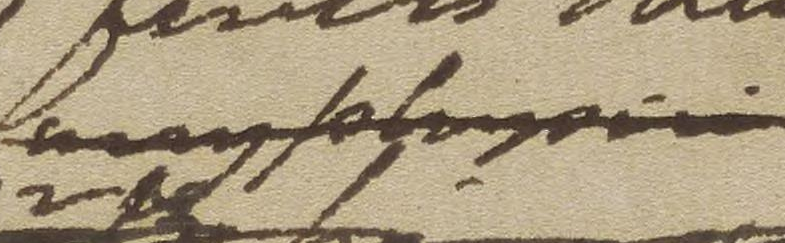[_____]
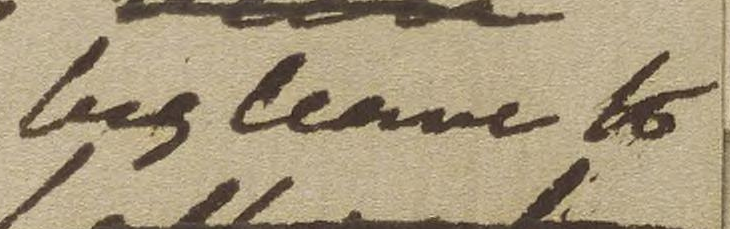Leeg Cease 16
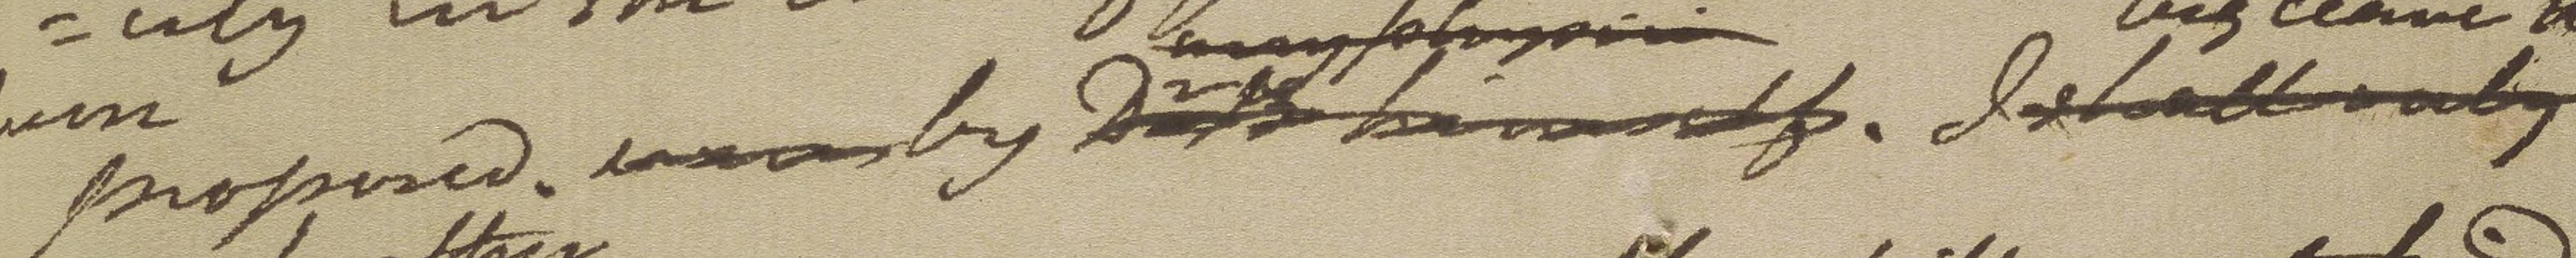proposed. [____] by [D^r himself]. I [shall only]
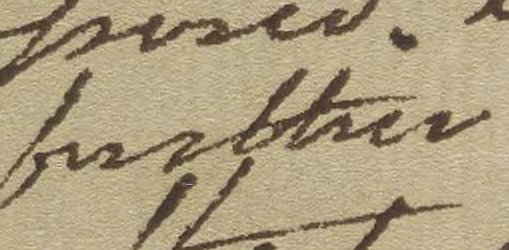further
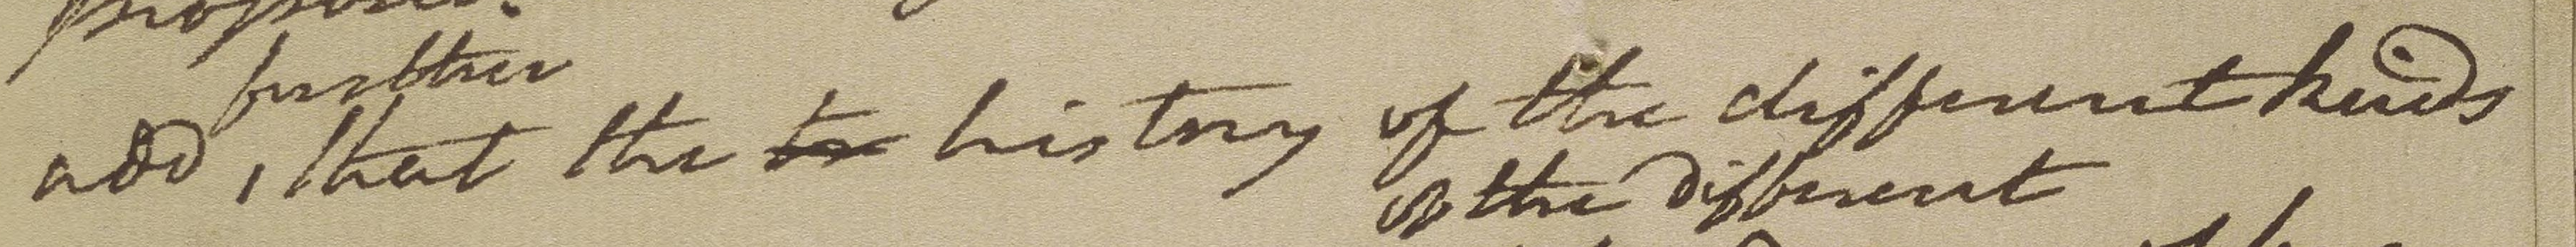add, that the history of the different kinds
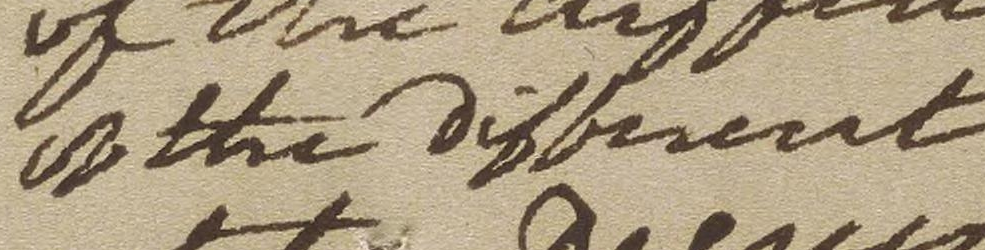of the different
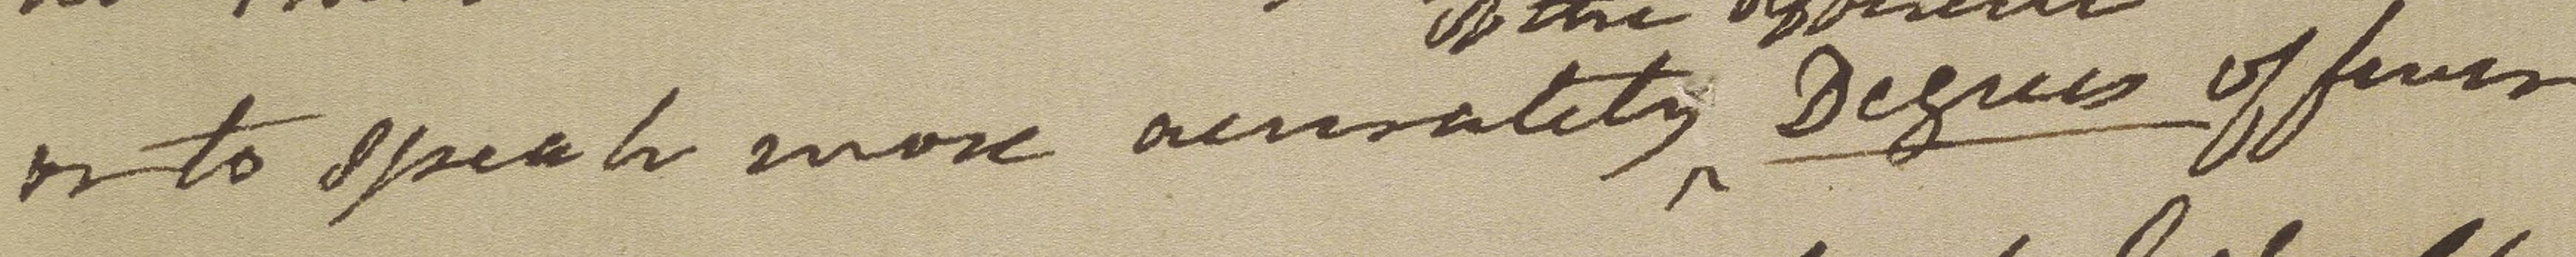or to speak more accurately ^ Degrees of fever
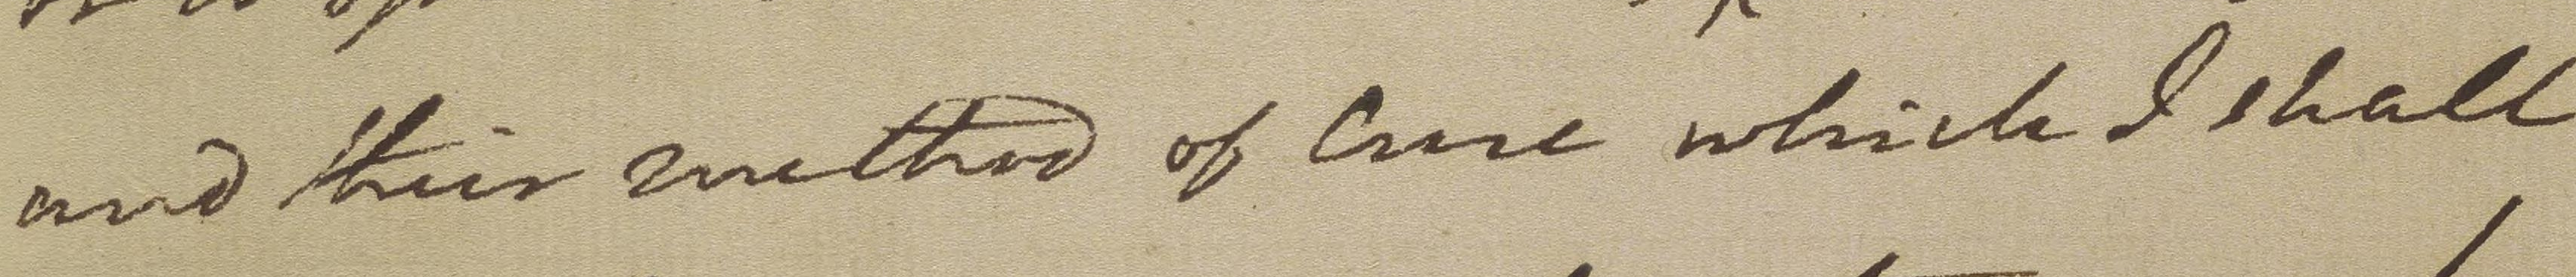and their method of cure which I shall
